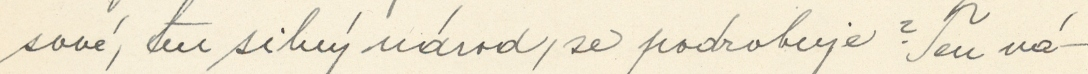sové, ten silný národ, se podrobuje? Ten ná-
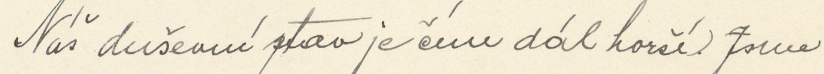Náš duševní stav je čím dál horší. Jsme
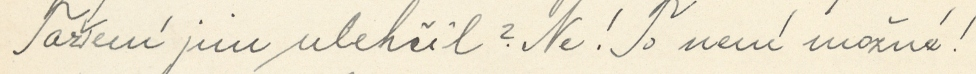Tažení jim ulehčil? Ne! To není možné!
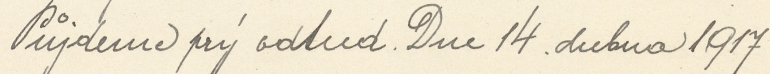Půjdeme prý odtud. Dne 14. dubna 1917
